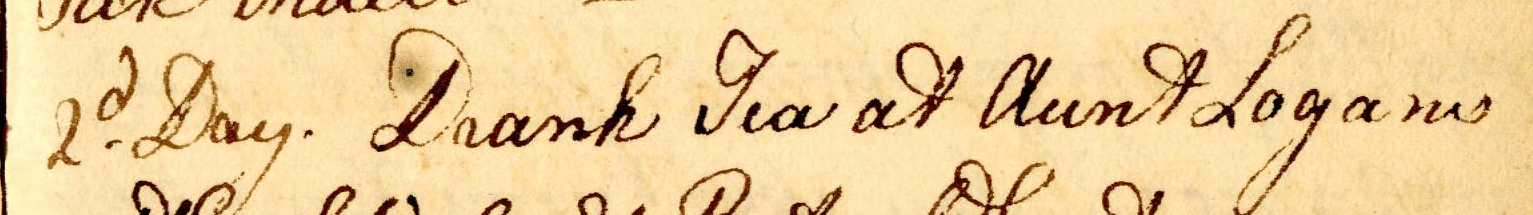2^d Day. Drank Tea at Aunt Logans
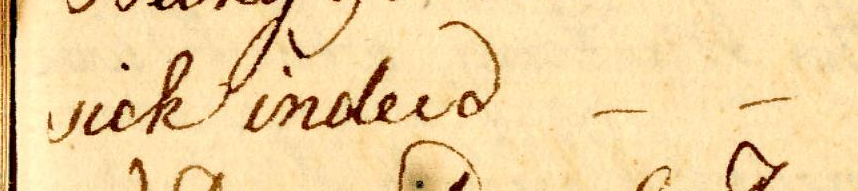sick indeed--
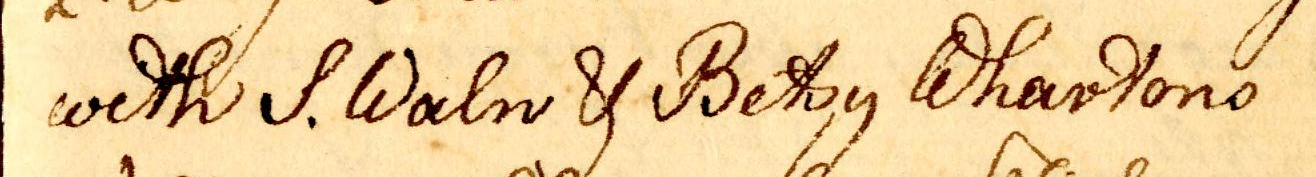with S. Waln & Betsy Whartons
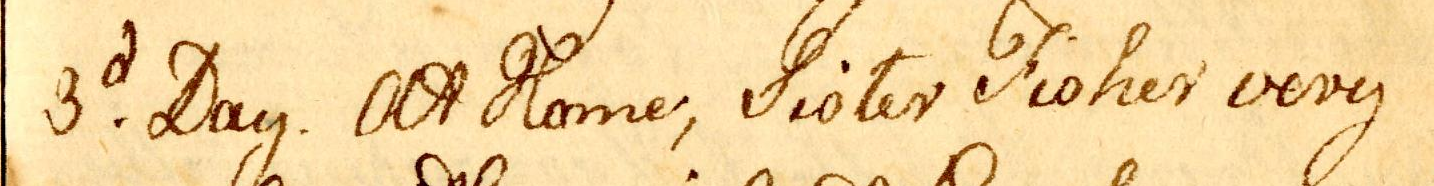3^d Day At Home, Sister Fisher very
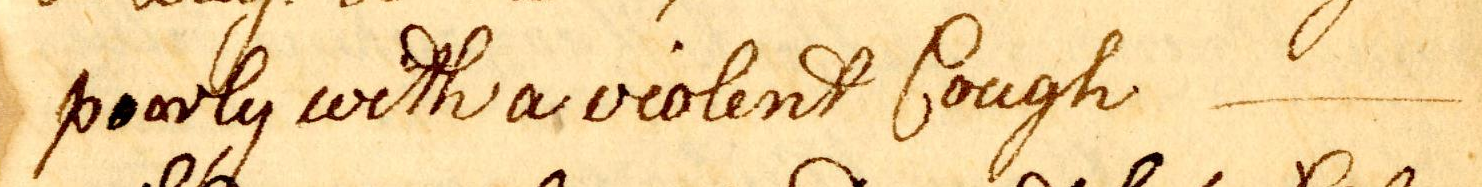poorly with a violent Cough
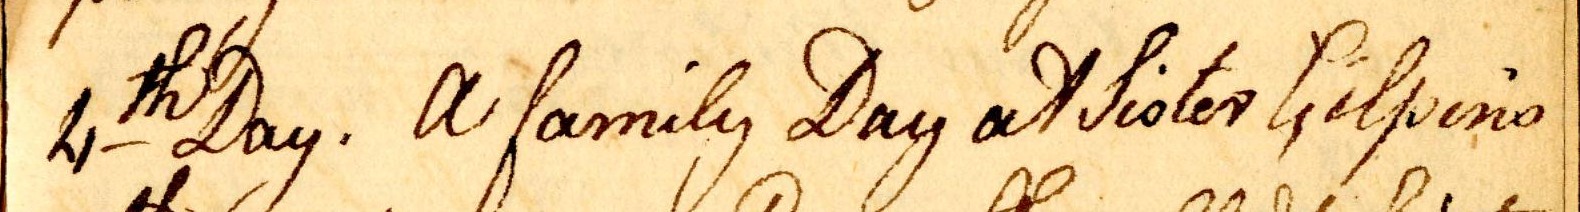4^th Day. A family Day at Sister Gilpins
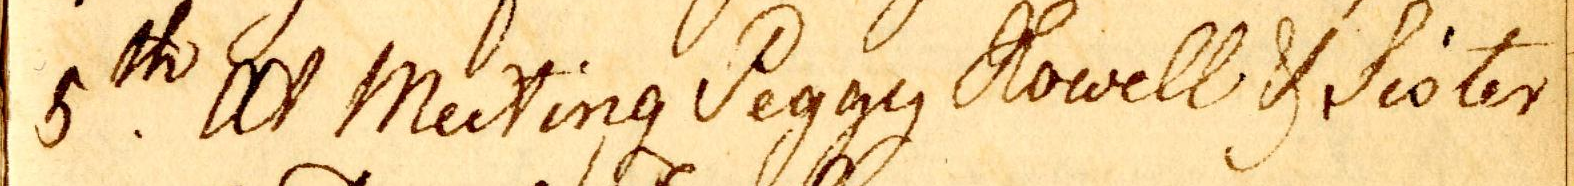5^th At Meeting Peggy Howell & Sister
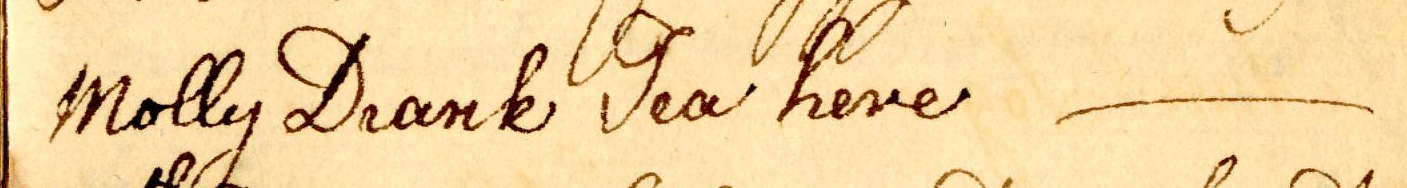Molly Drank Tea here-
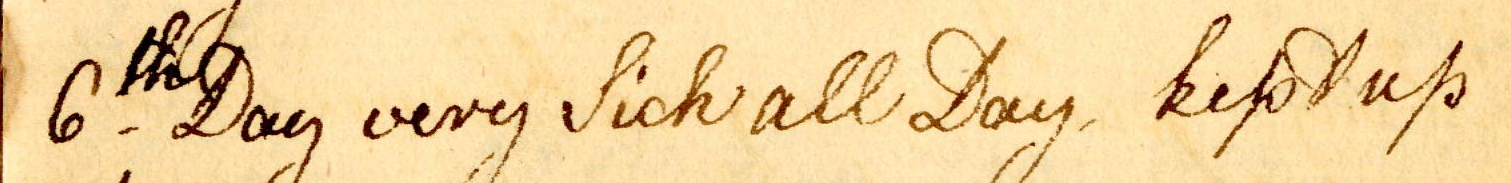6^th Day very Sick all Day, kept up
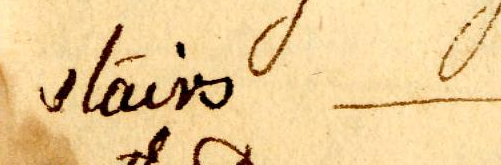stairs-
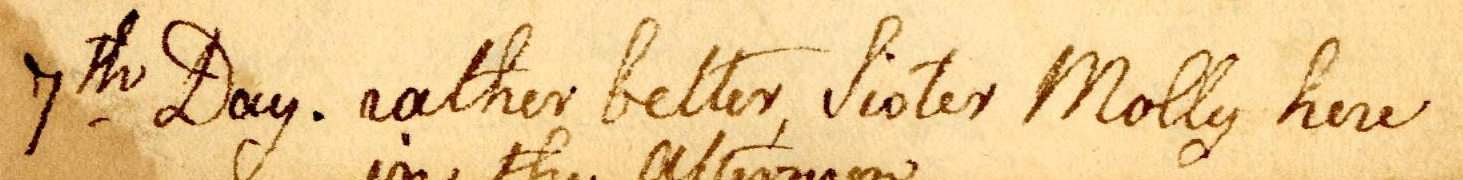7^th Day. rather better, Sister Molly here
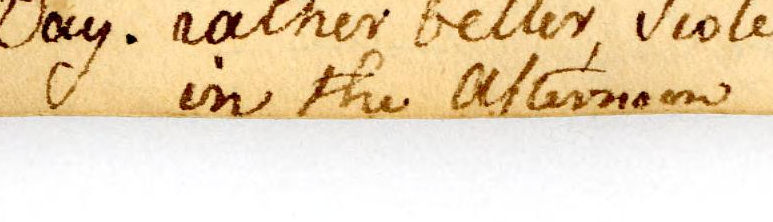in the Afternoon
